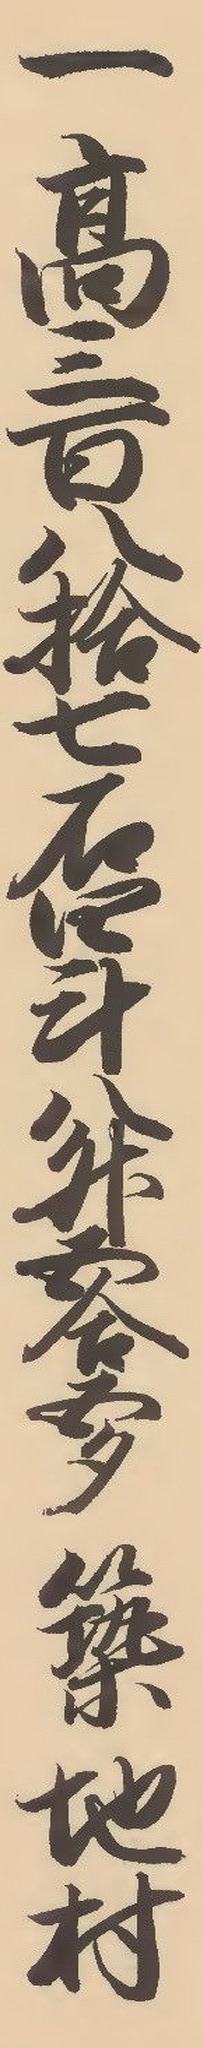一高三百八拾七石四斗八升五合五勺築地村
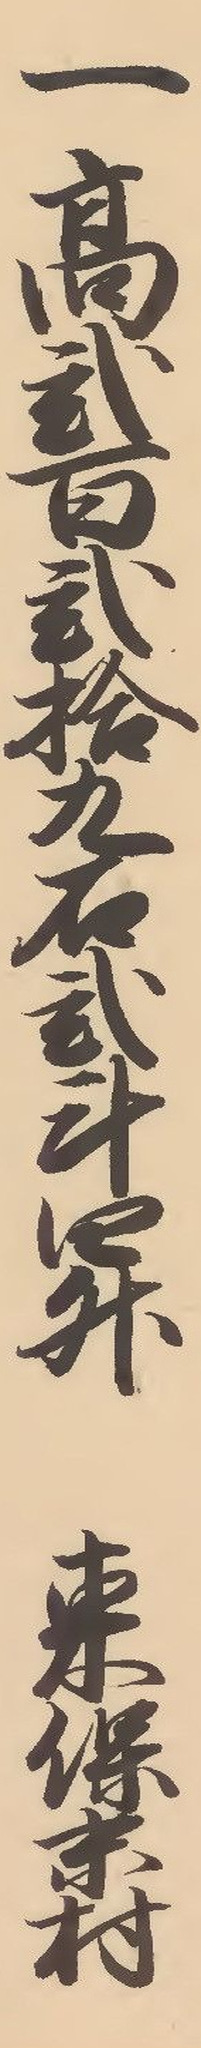一高弐百弐拾九石弐斗四升東保末村
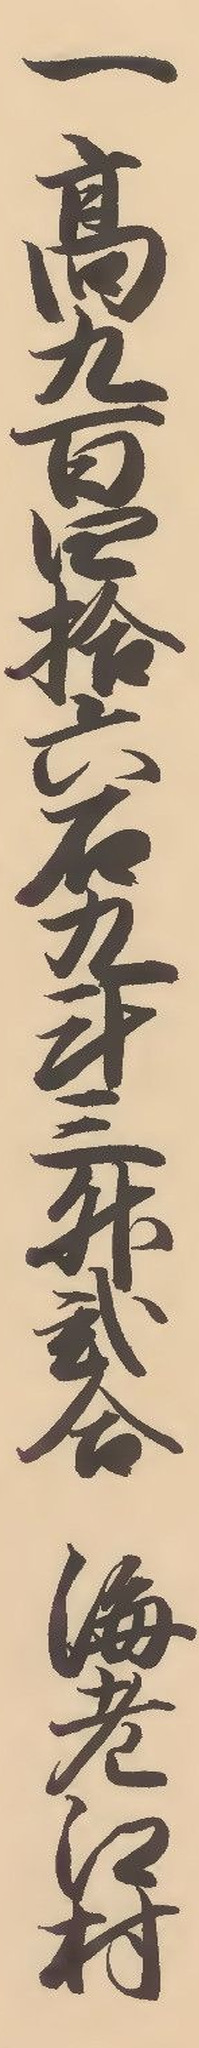一高九百四拾六石九斗三升弐合海老江村

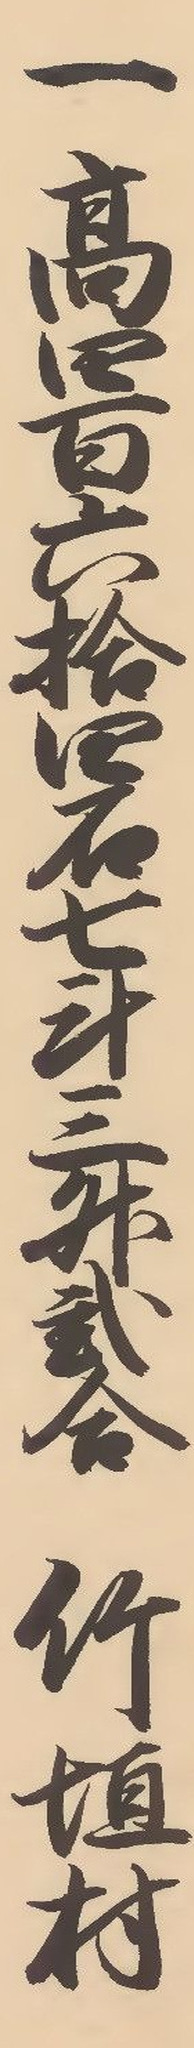一高四百六拾四石七斗三升弐合竹垣村
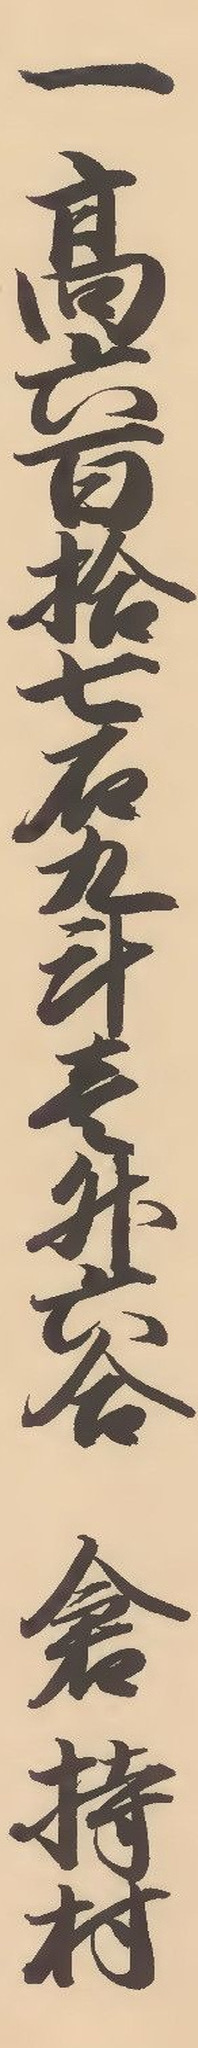一高六百拾七石九斗壱升六合倉持村
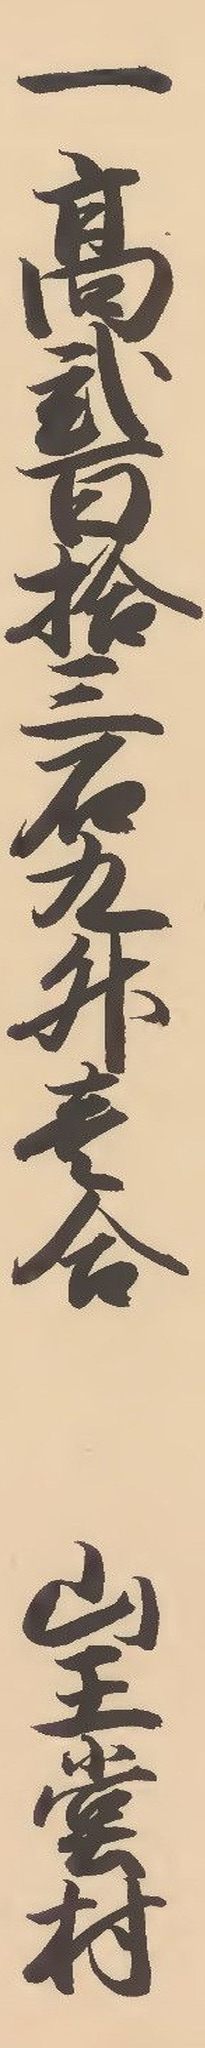一高弐百拾三石九升壱合山王堂村
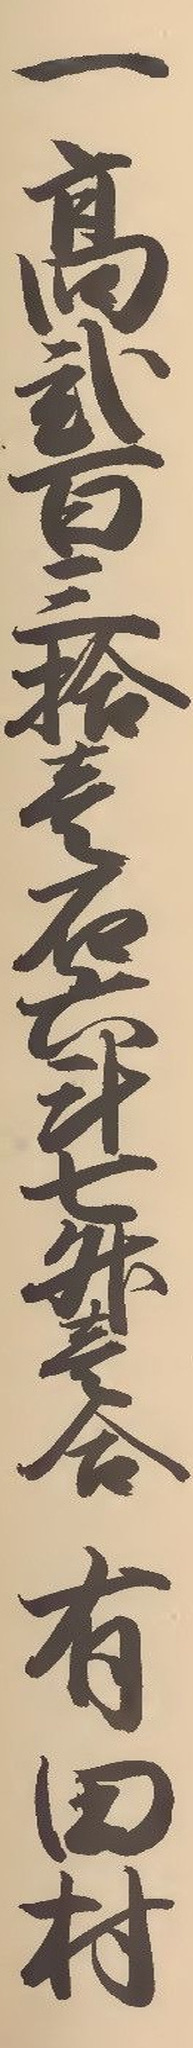一高弐百三拾壱石六斗七升壱合有田村
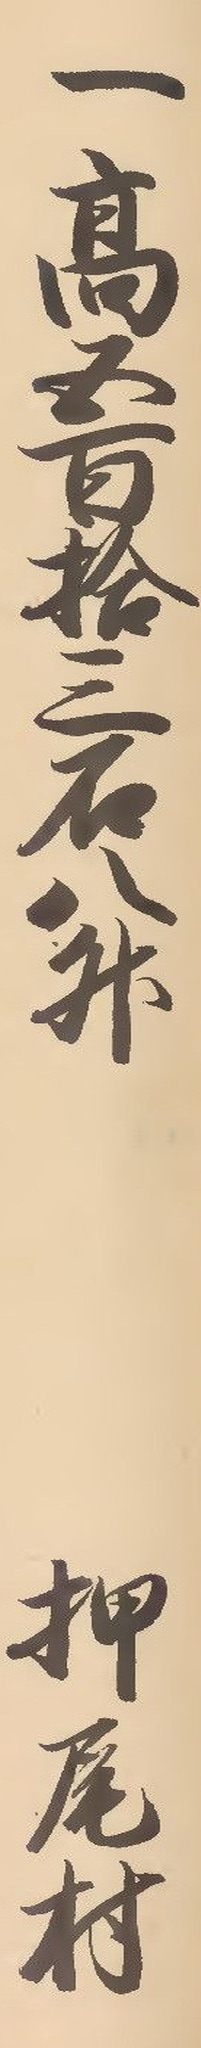一高五百拾三石八升押尾村
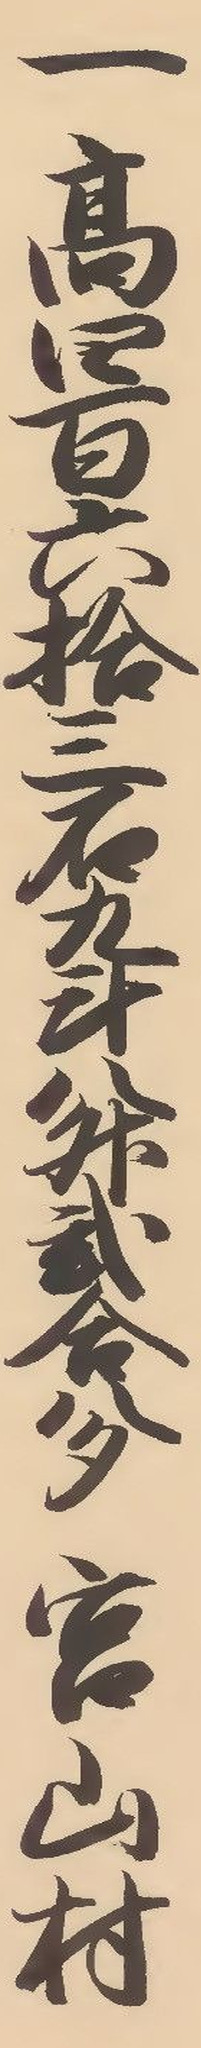一高四百六拾三石九斗八升弐合八勺宮山村
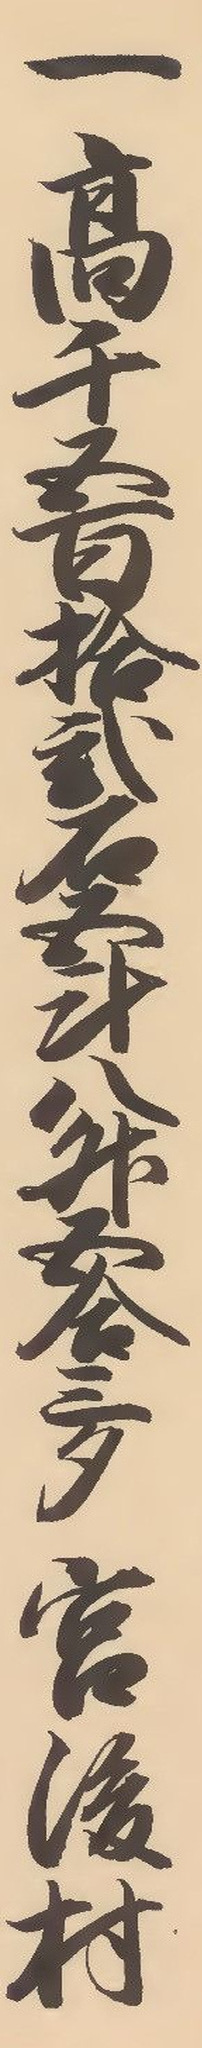一高千五百拾弐石五斗八升五合三勺宮後村
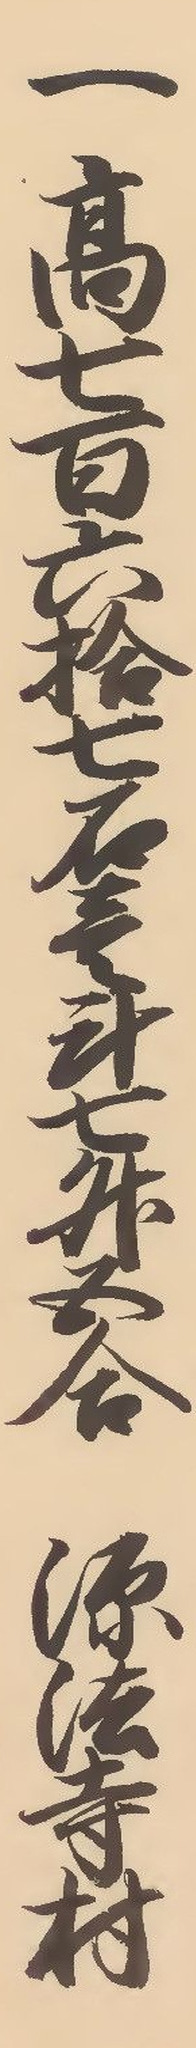一高七百六拾七石壱斗七升五合源法寺村

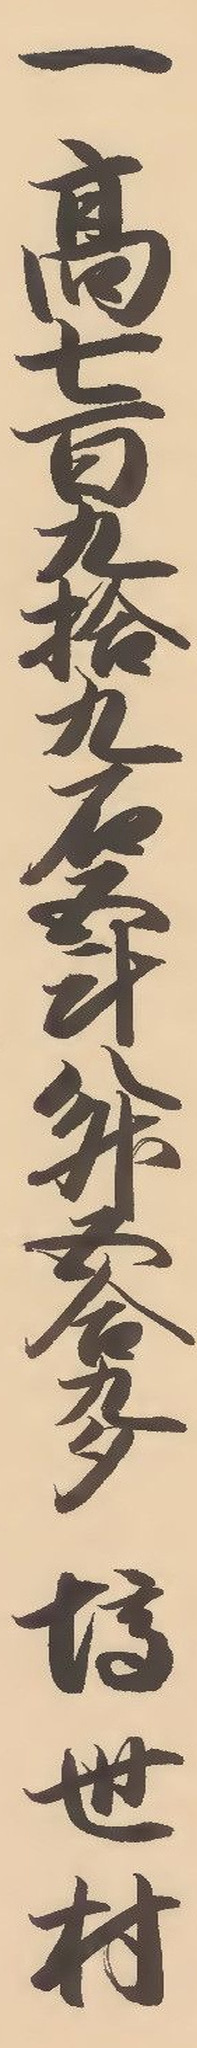一高七百九拾九石五斗八升五合九勺塙世村
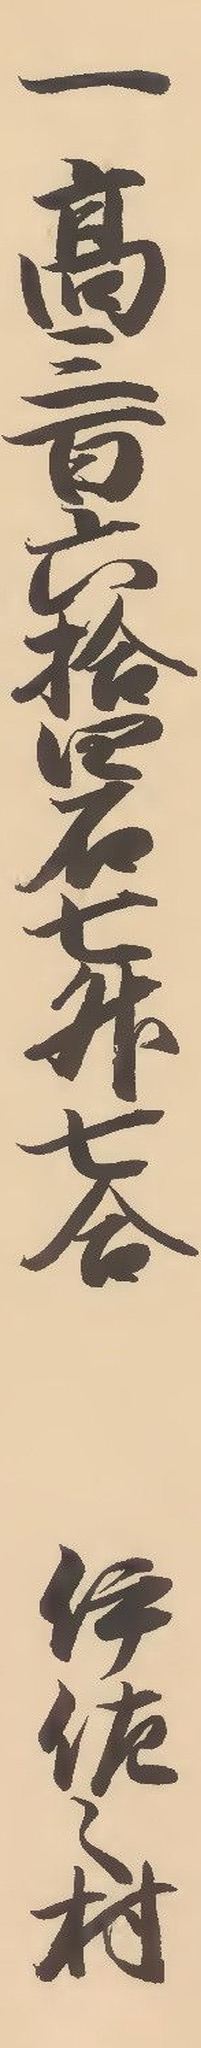一高三百六拾四石七升七合伊佐々村
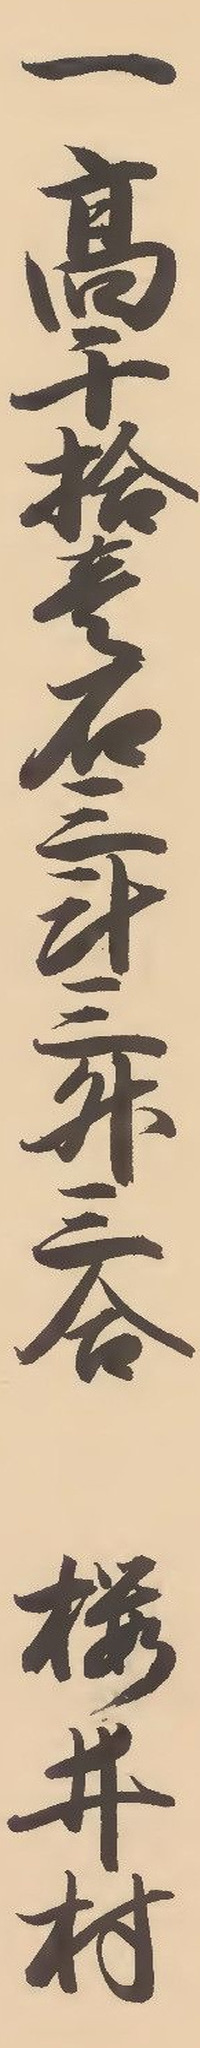一高千拾壱石三斗三升三合桜井村
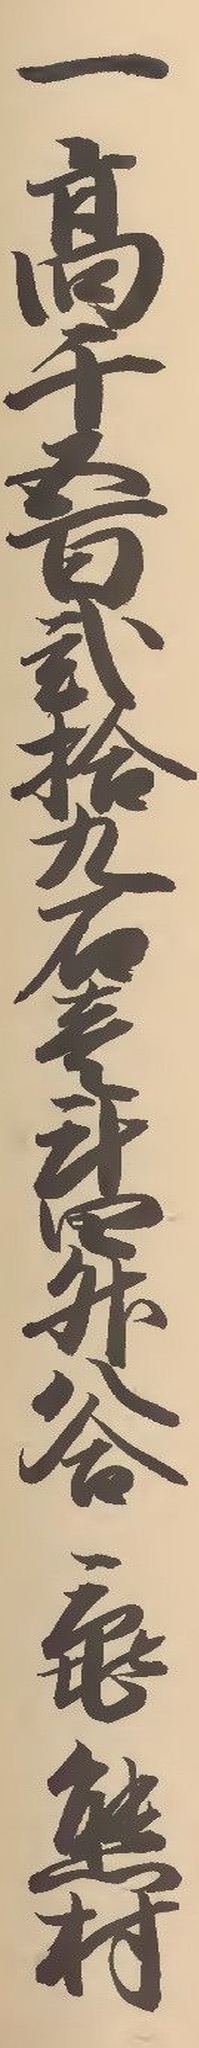一高千五百弐拾九石壱斗四升八合亀熊村
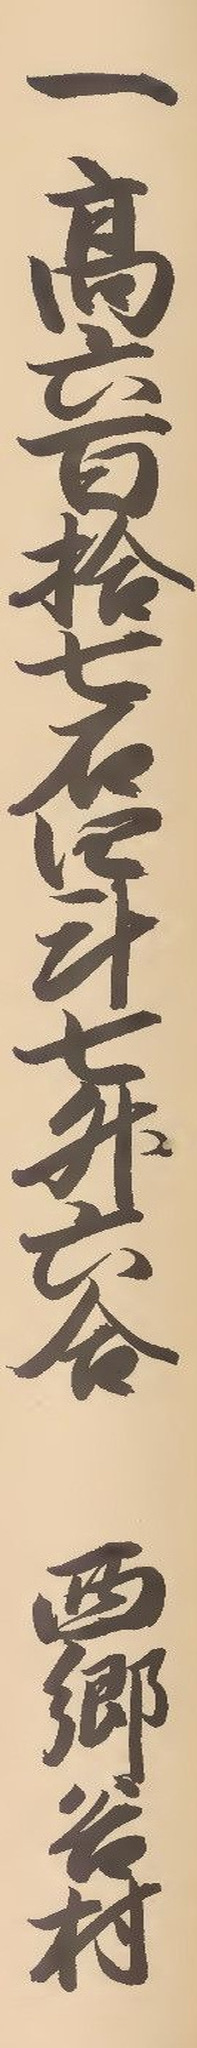一高六百拾七石四斗七升六合西郷谷村
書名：常陸国郷帳
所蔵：国立公文書館 National Archives of Japan
